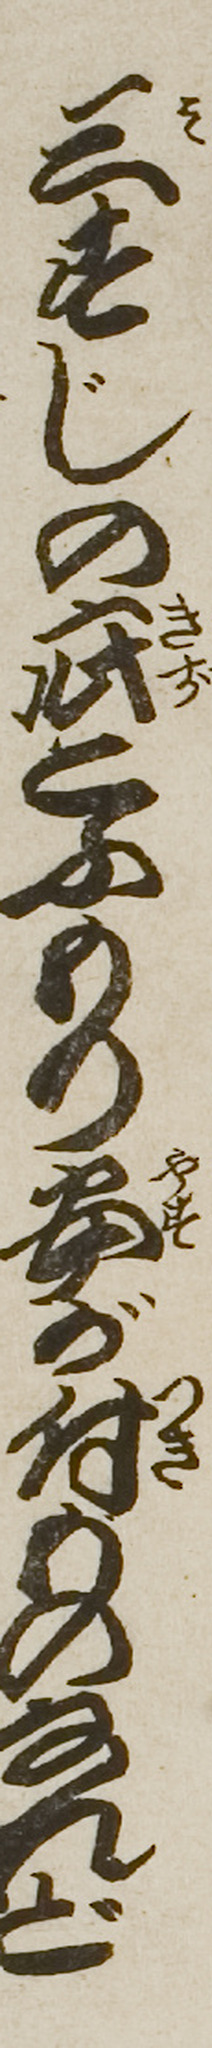三すじの疵こふもり安が付ものなれど
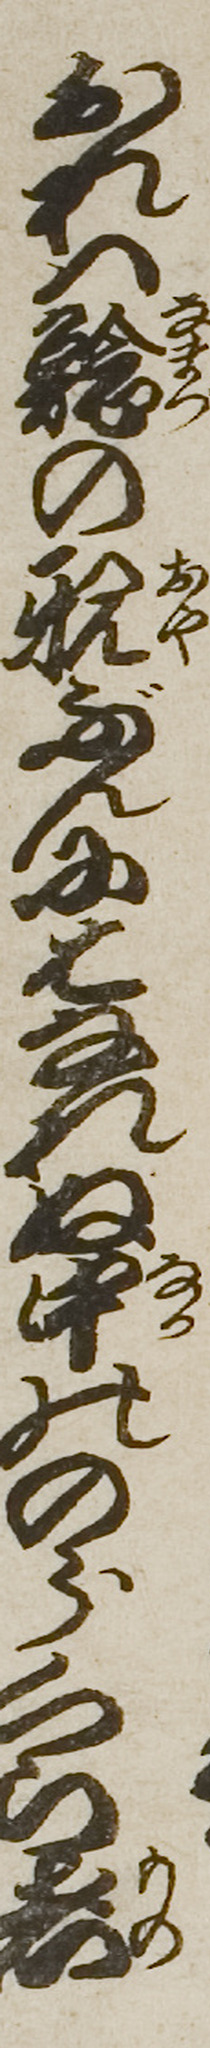おれは鯰の親ぶんにはなれぬ中ののらくら者
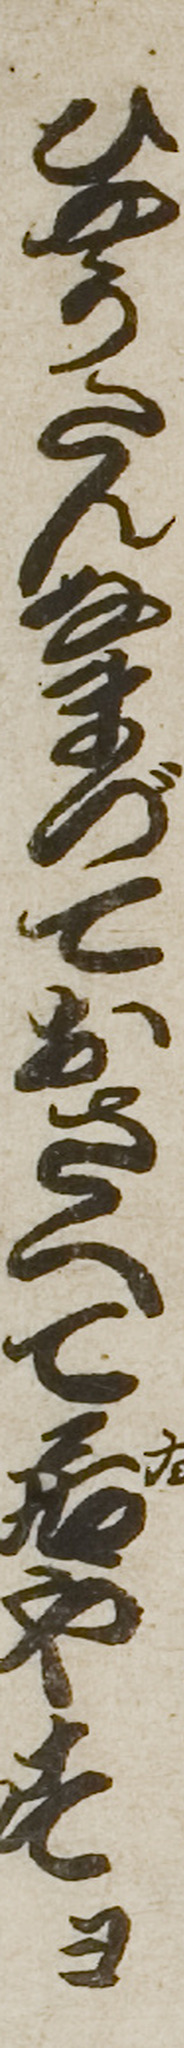ひやうたんなまづておさへて居やすヨ
